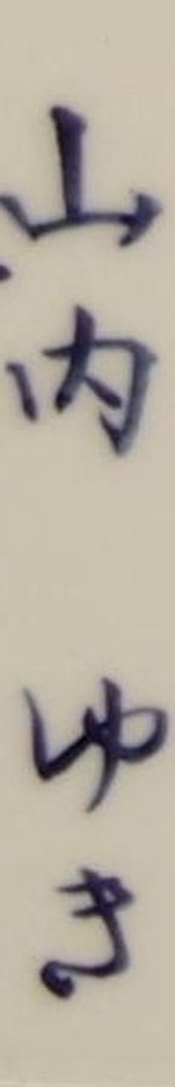山内ゆき
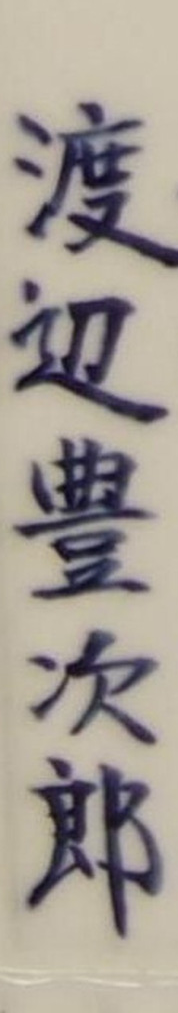渡辺豊次郎

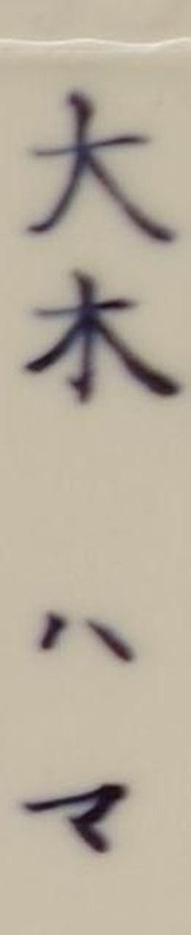大木ハマ
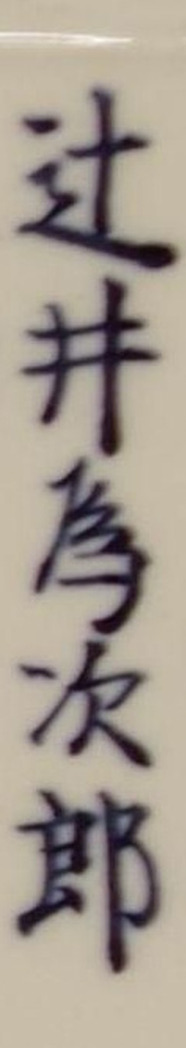辻井為次郎
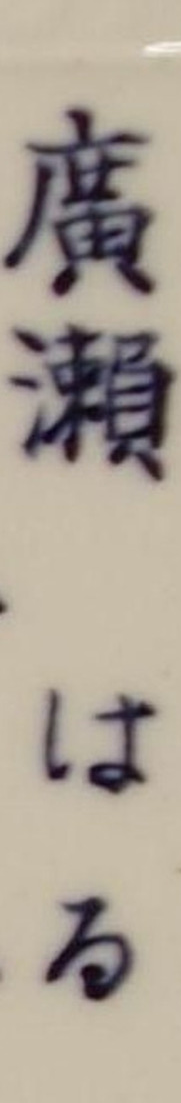廣瀬はる
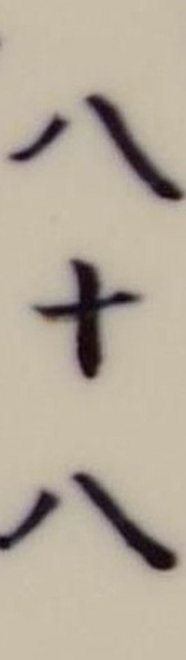八十八
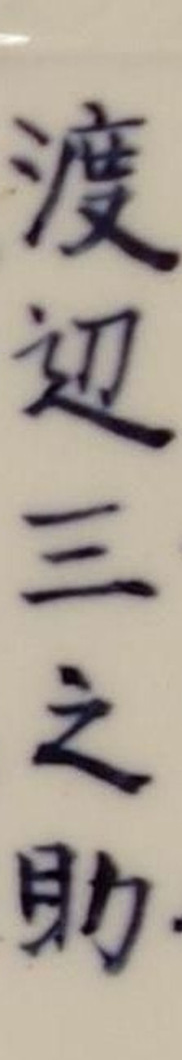渡辺三之助
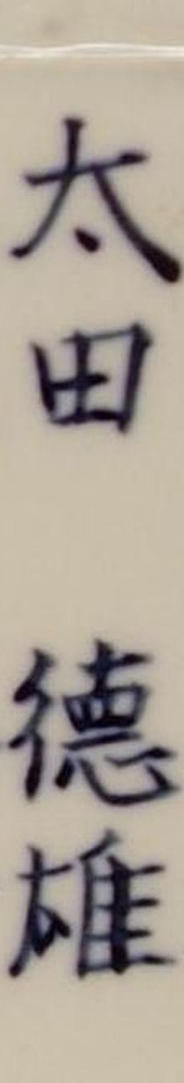太田徳雄
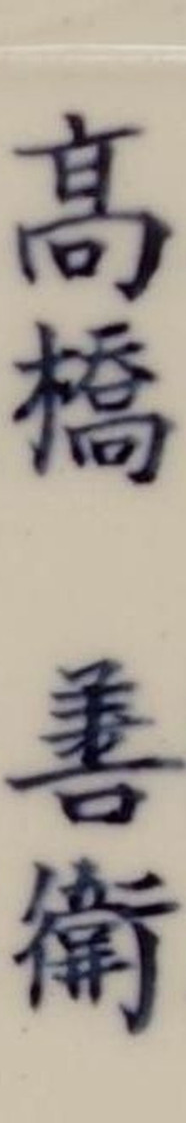高橋善衛
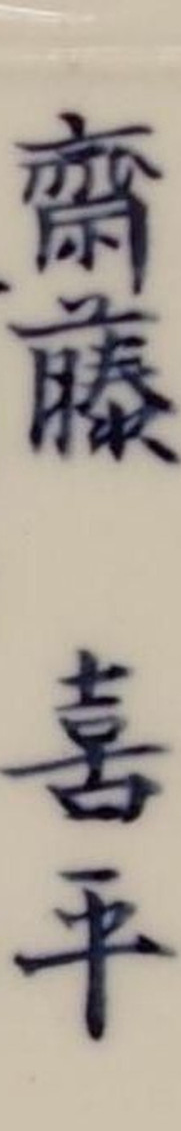齋藤喜平
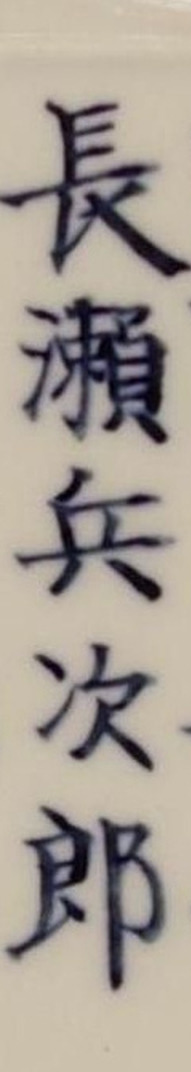長瀬兵次郎
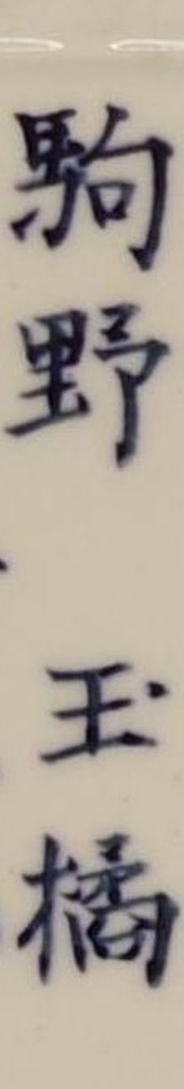駒野玉橘
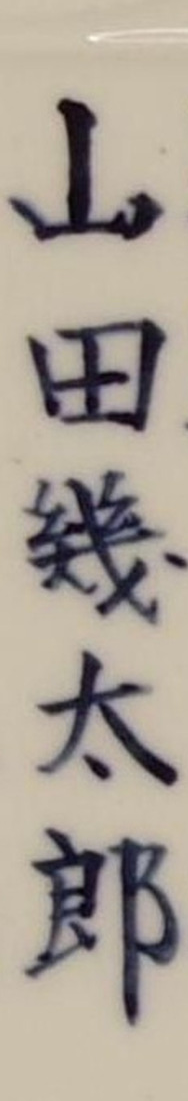山田幾太郎
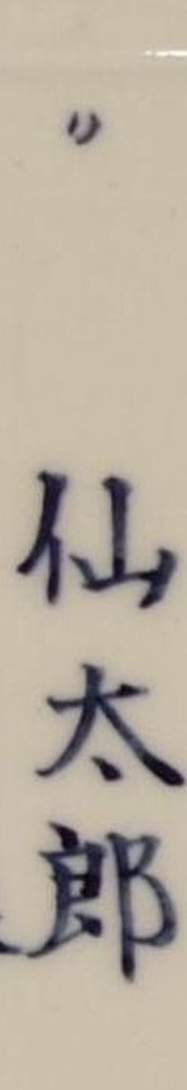仙太郎
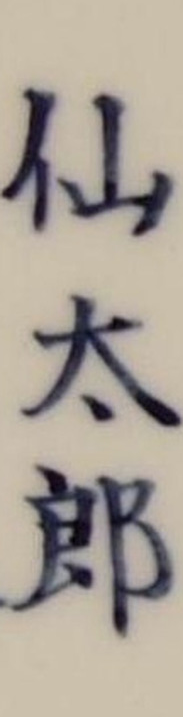仙太郎
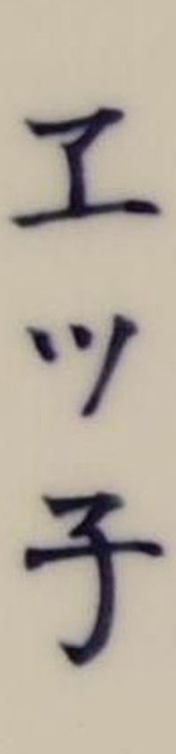エツ子
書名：M~S
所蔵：高野山金剛峯寺
